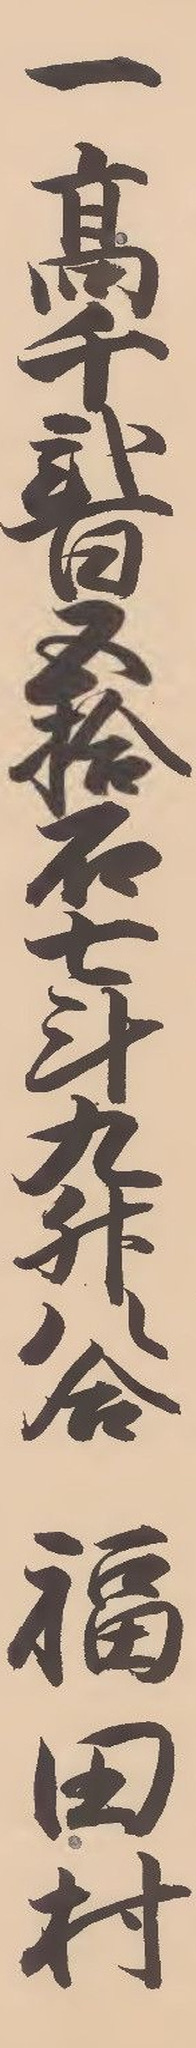一高千弐百五拾石七斗九升八合福田村
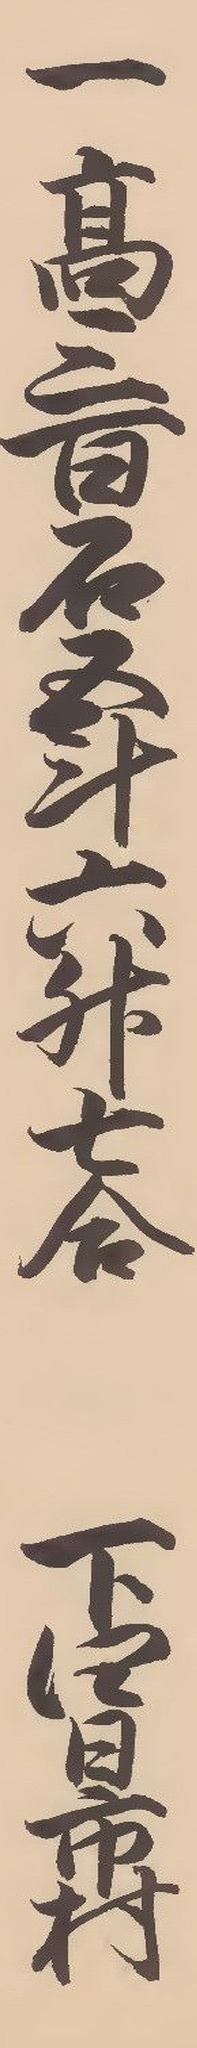一高三百石五斗六升七合下四日市村
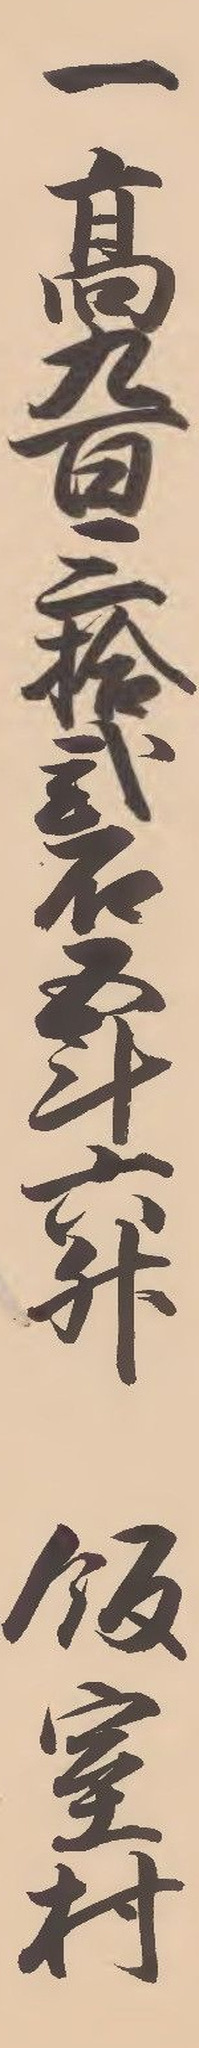一高九百三拾弐石五斗六升飯室村
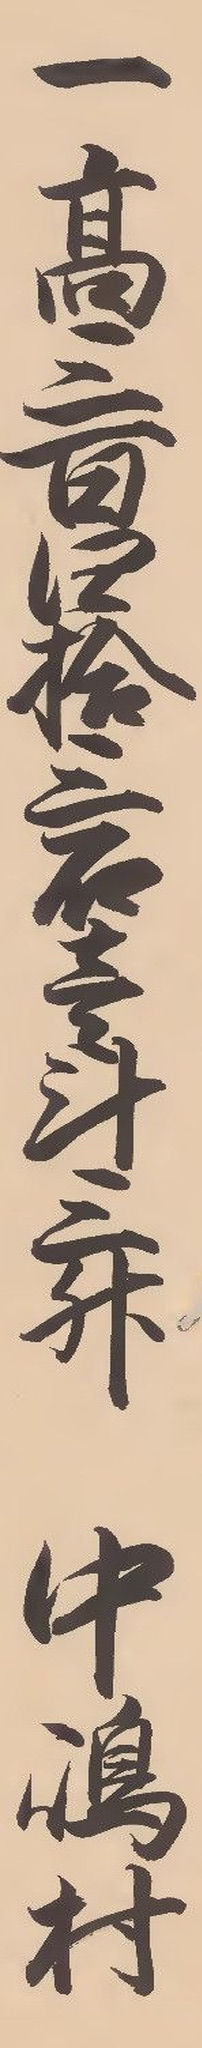一高三百四拾三石壱斗三升中島村
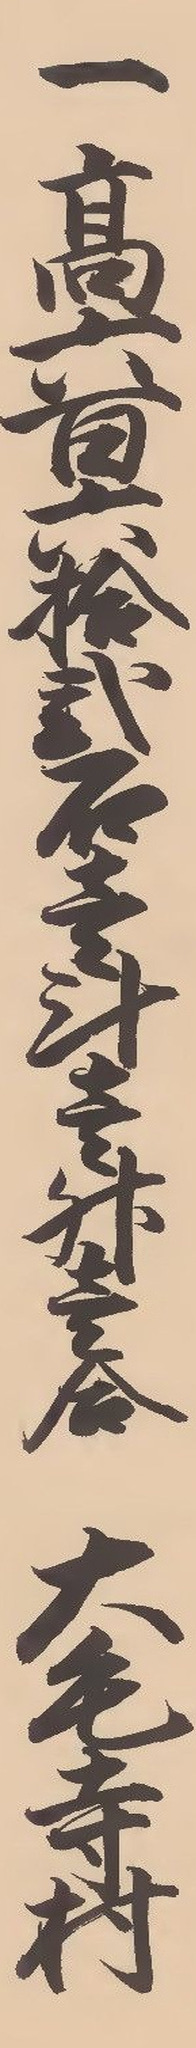一高六百六拾弐石壱斗壱升壱合大毛寺村
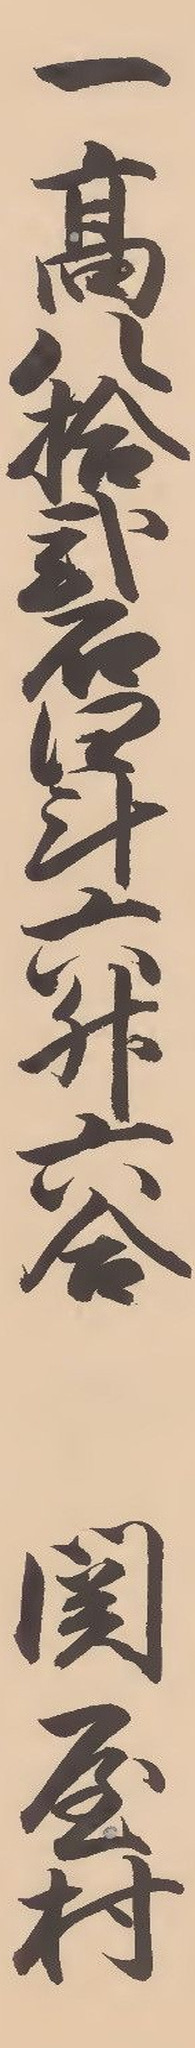一高八拾弐石四斗六升六合関谷村
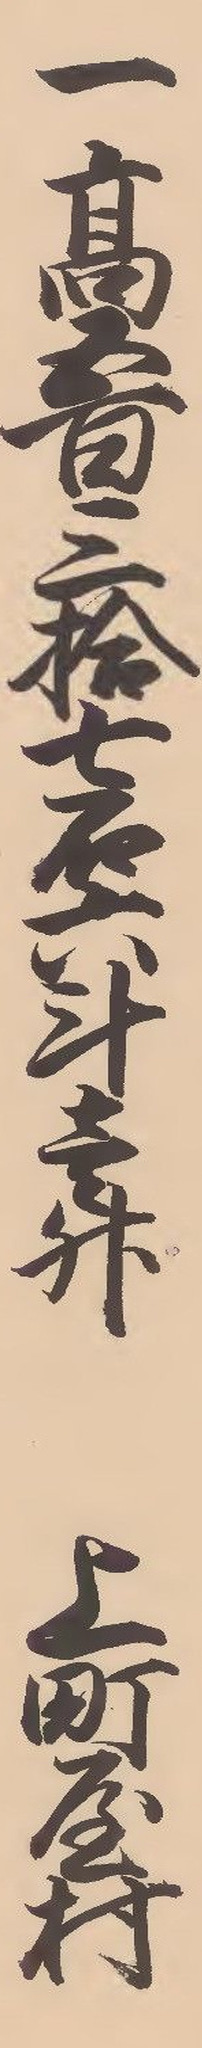一高五百三拾七石六斗壱升上町屋村

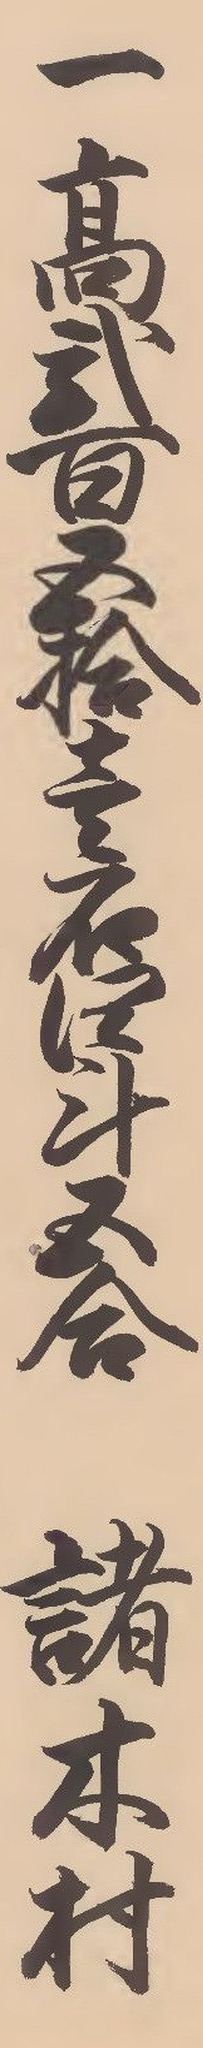一高弐百五拾壱石四斗五合諸木村
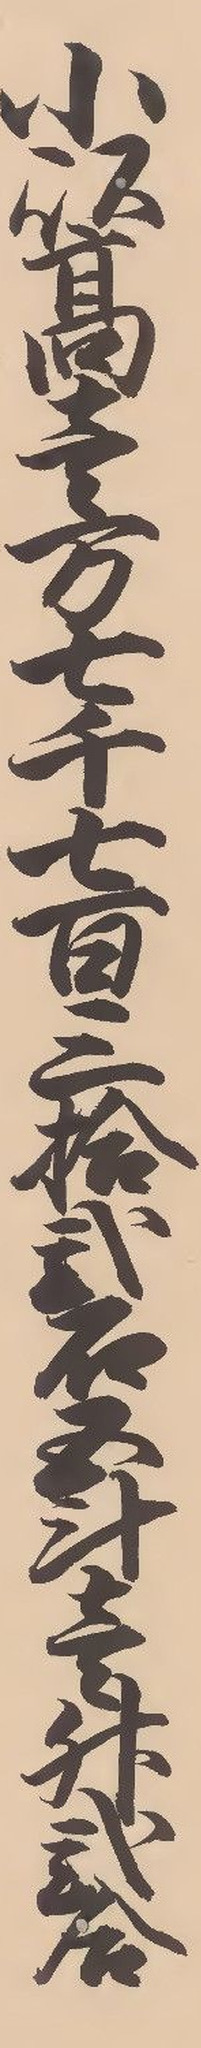小以高壱万七千七百三拾弐石五斗壱升弐合
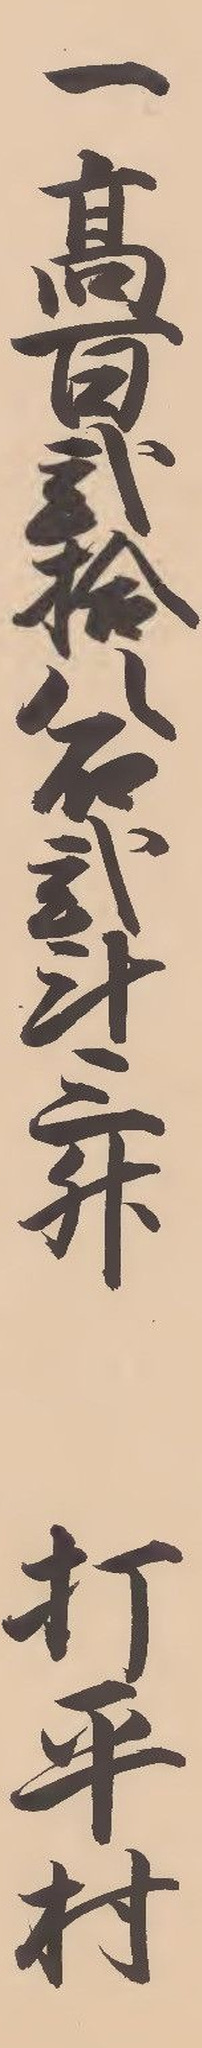一高百弐拾八石弐斗三升打平村
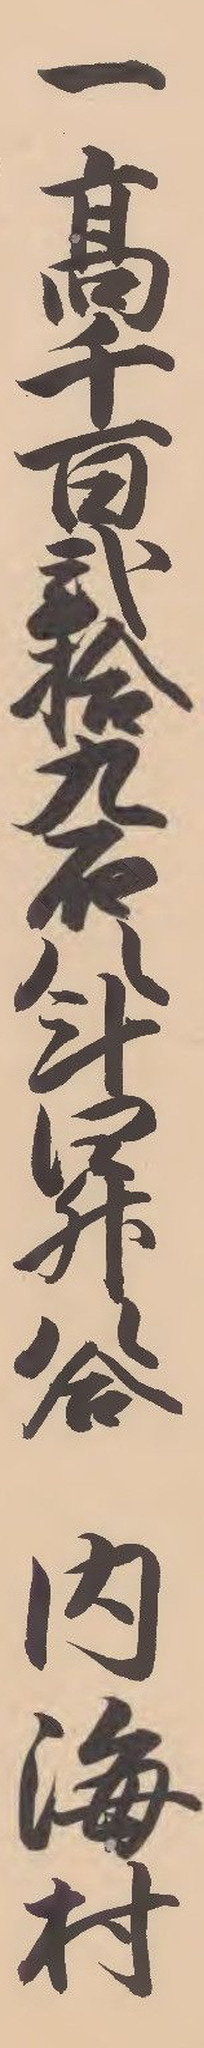一高千百弐拾九石八斗四升八合内海村

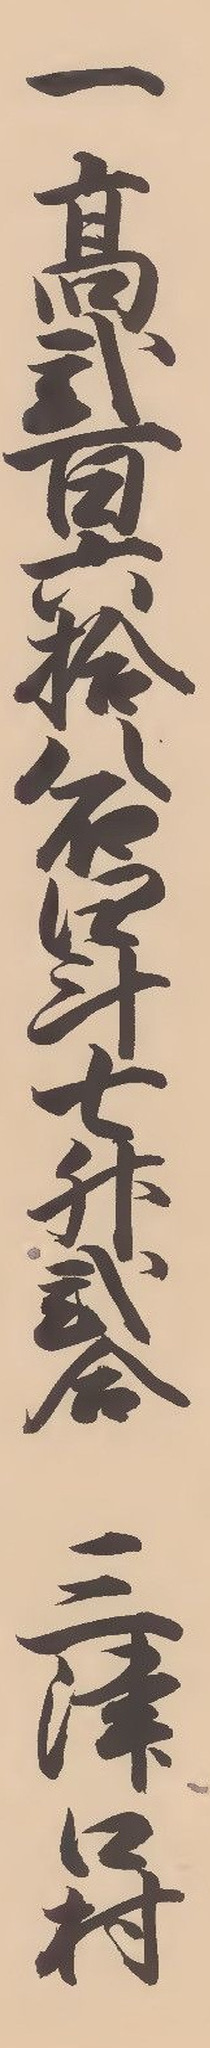一高弐百六拾八石四斗七升弐合三津口村
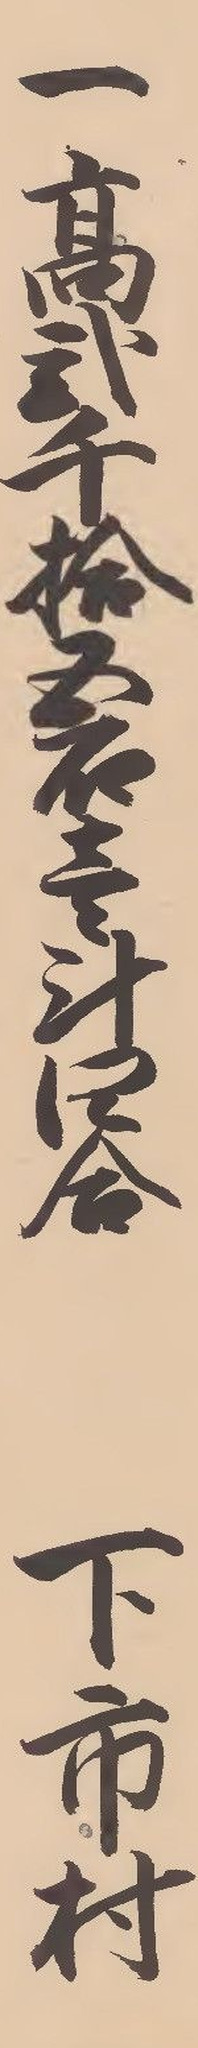一高弐千拾五石壱斗四合下市村
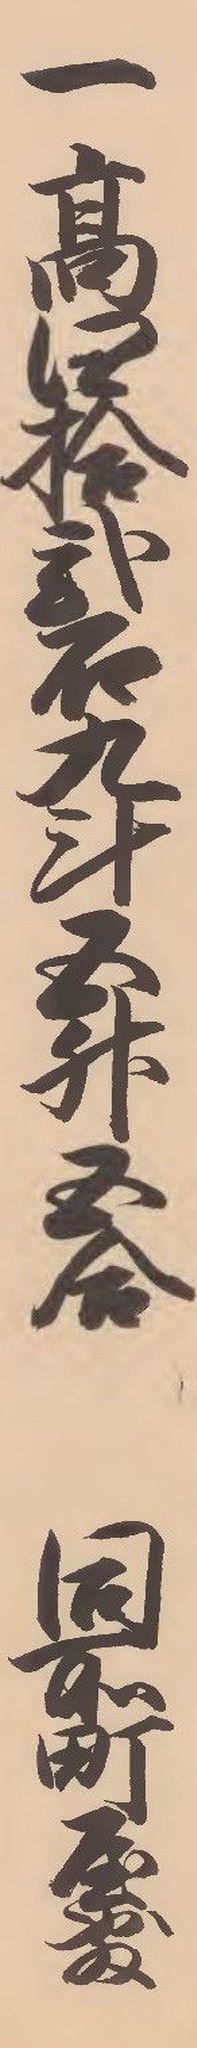一高四拾弐石九斗五升五合同所町屋敷
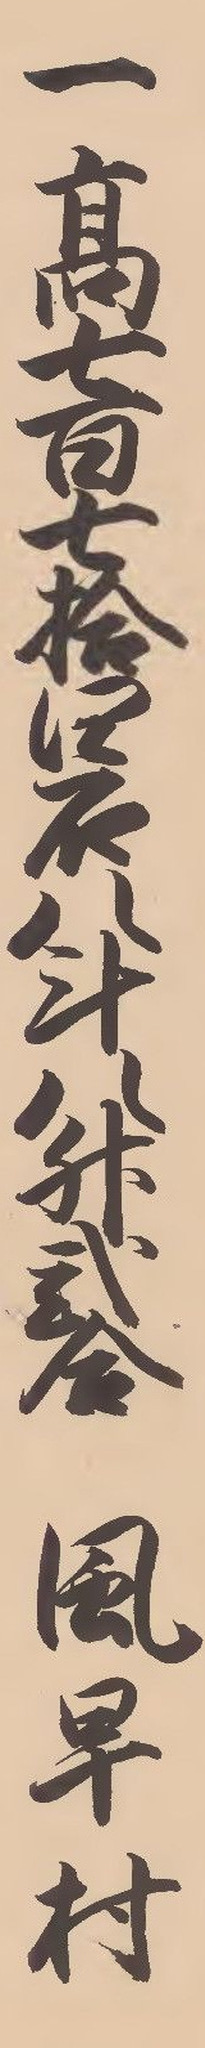一高七百七拾四石八斗八升弐合風早村
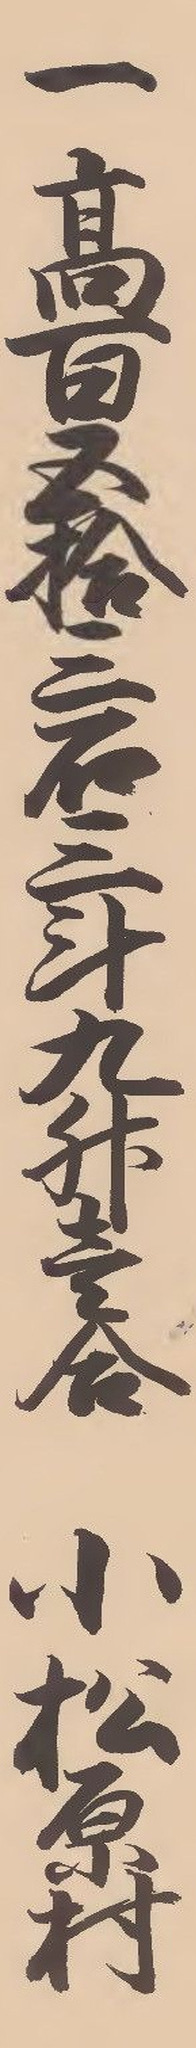一高百五拾三石三斗九升壱合小松原村
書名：安芸国郷帳
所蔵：国立公文書館 National Archives of Japan
